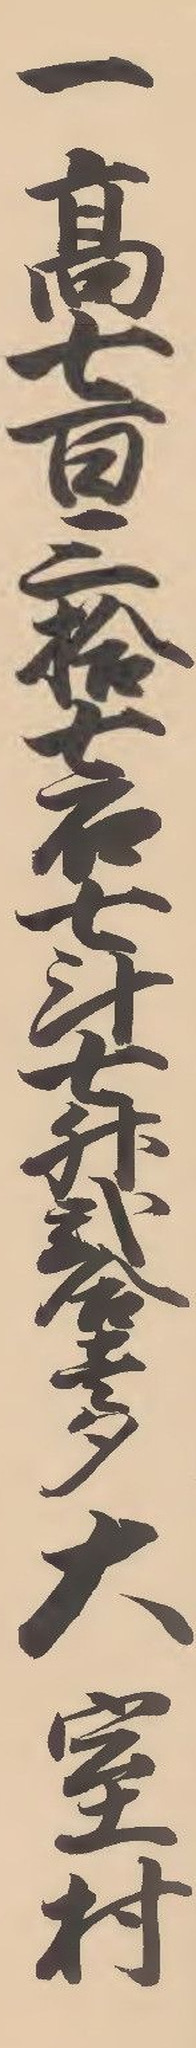一高七百三拾七石七斗七升弐合壱勺大室村
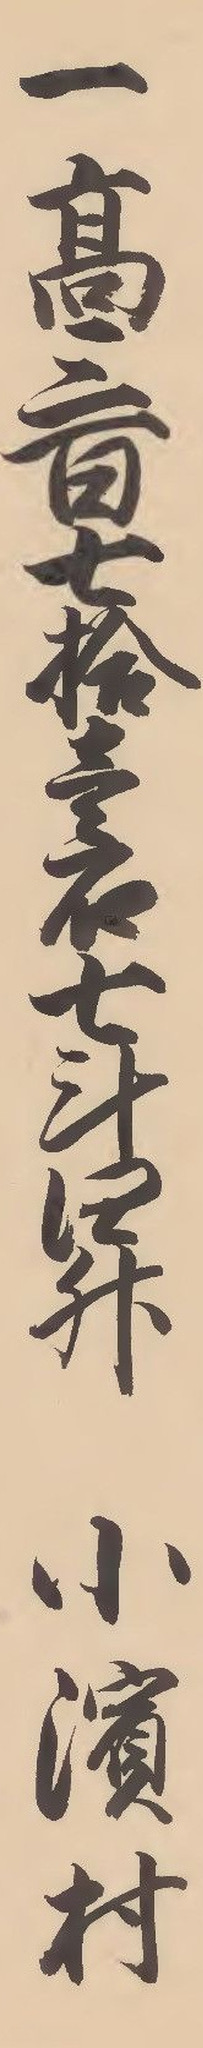一高三百七拾壱石七斗四升小濱村
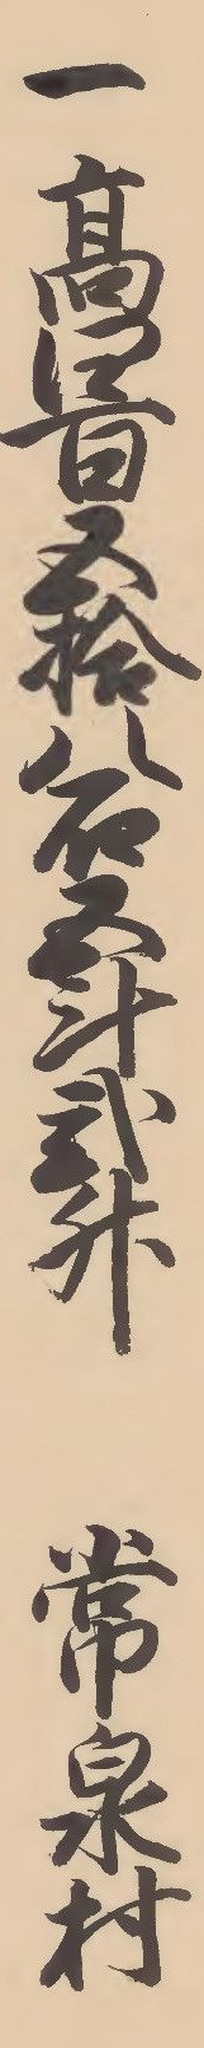一高四百五拾八石五斗弐升常泉村
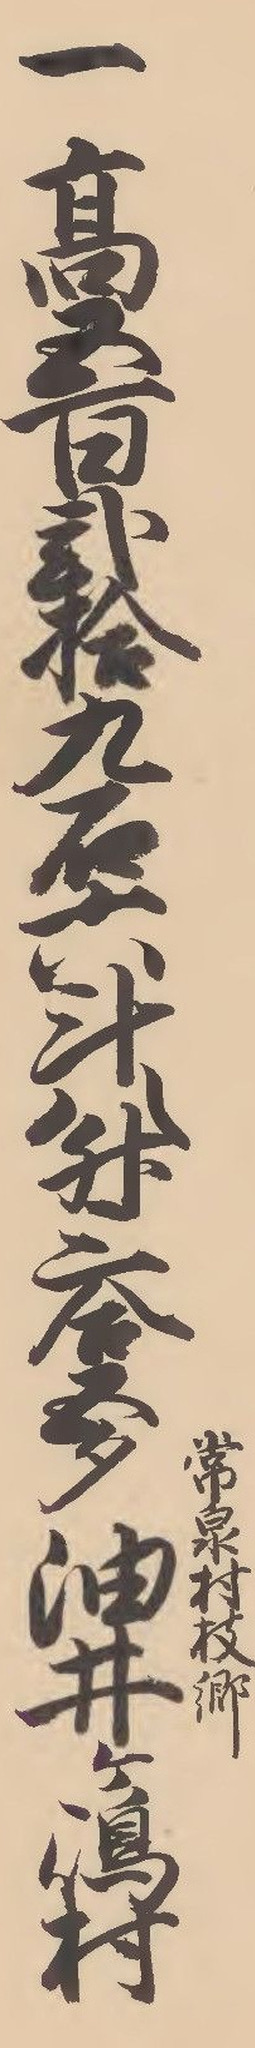一高五百弐拾九石六斗八升三合五勺油井ヶ嶋村

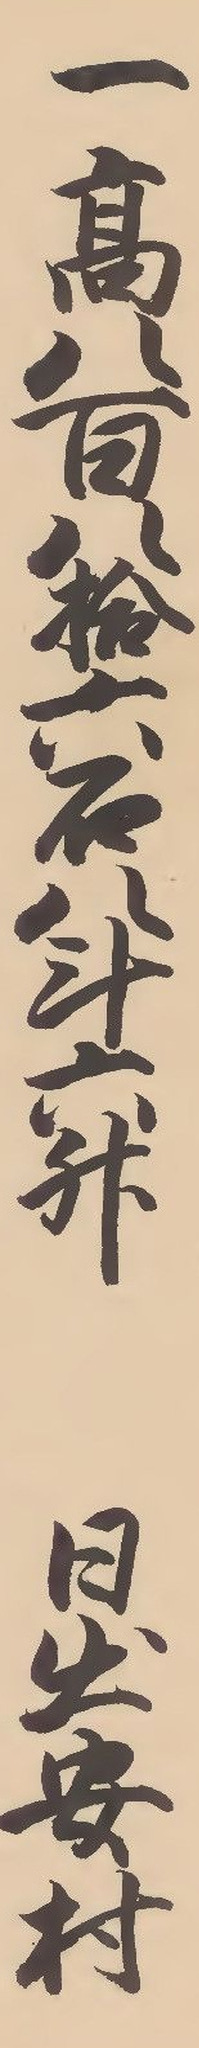一高八百八拾六石八斗六升日出安村
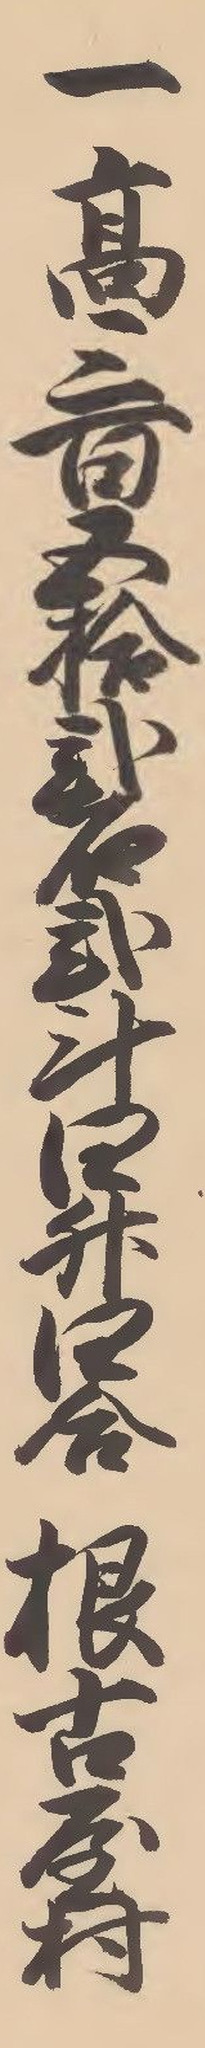一高三百五拾弐石弐斗四升四合根古屋村
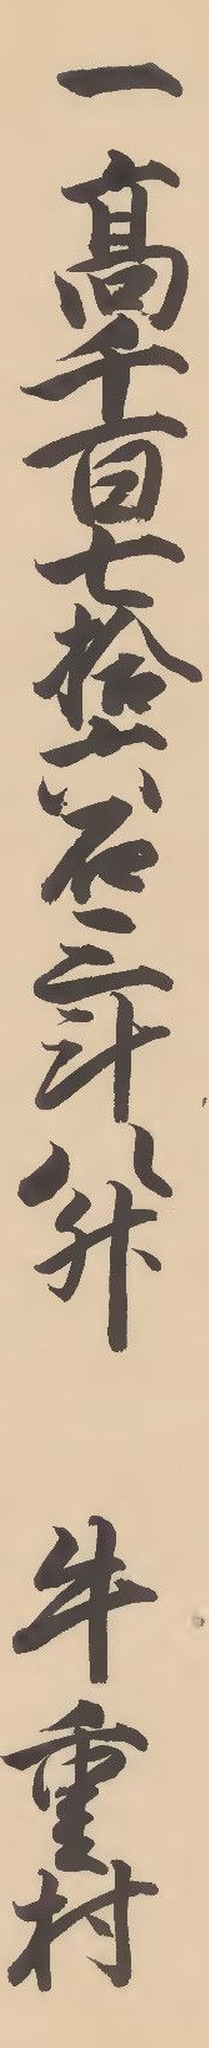一高千百七拾六石三斗八升牛重村
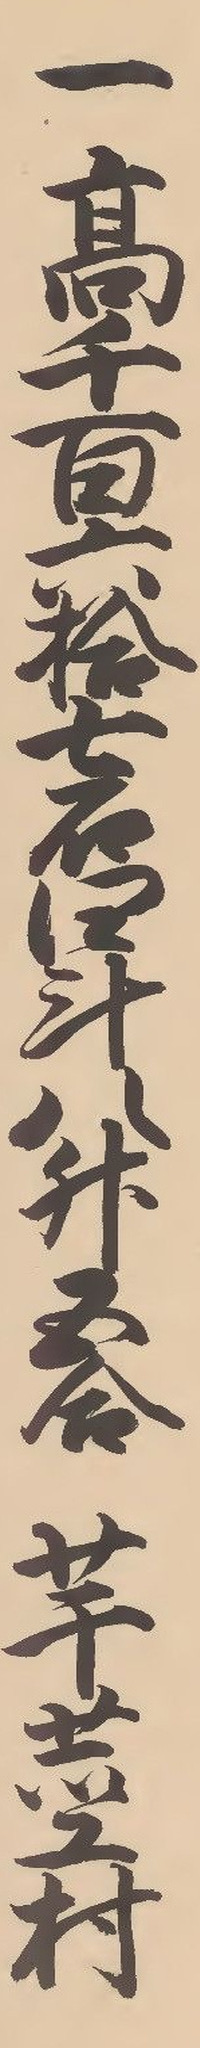一高千百六拾七石四斗八升五合芋茎村
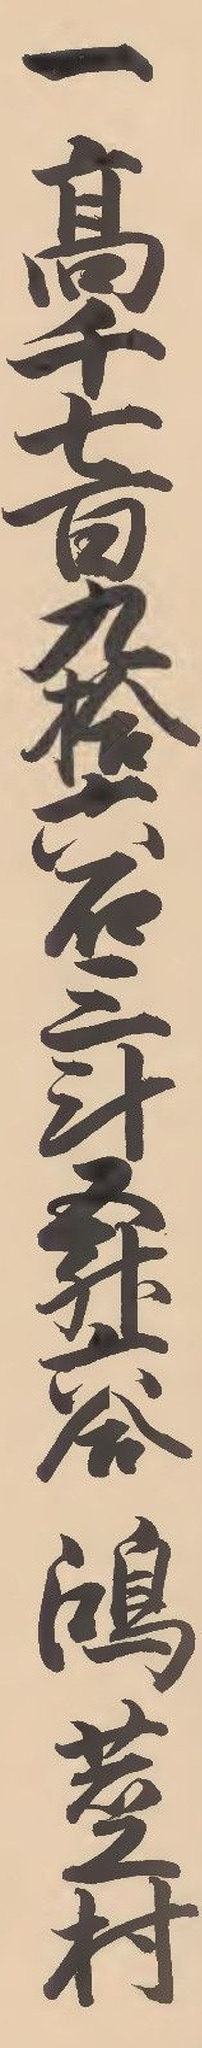一高千七百九拾六石三斗五升六合鴻茎村
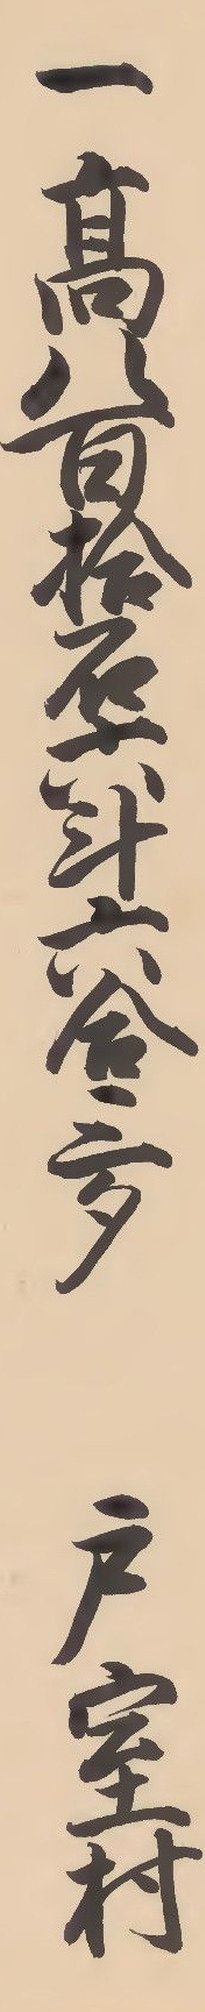一高八百拾石六斗六合三勺戸室村
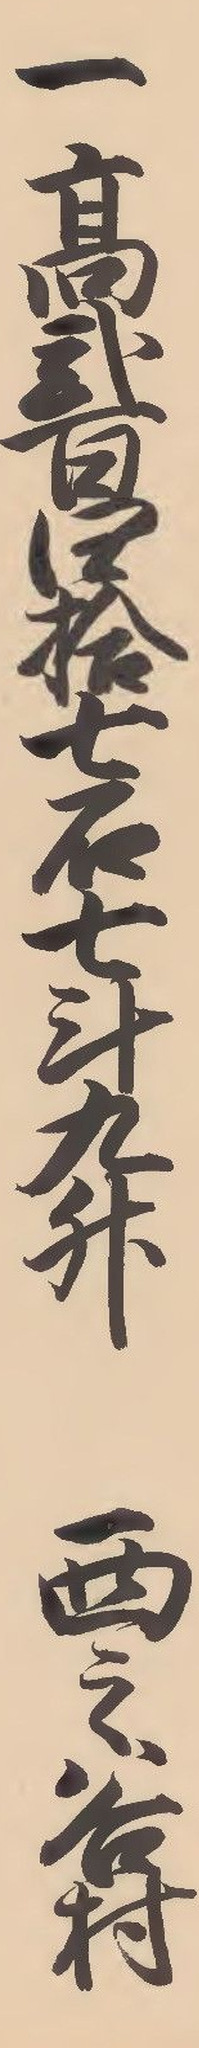一高弐百四拾七石七斗九升西之谷村
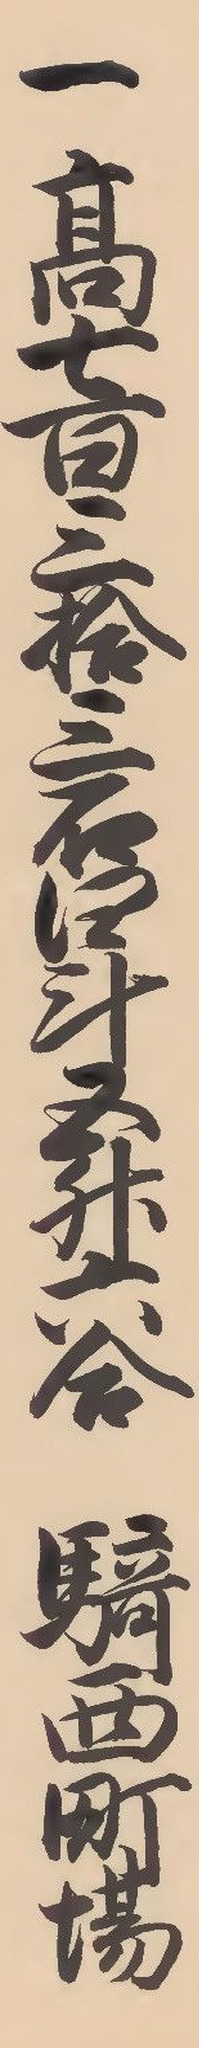一高七百三拾三石四斗五升六合騎西町場

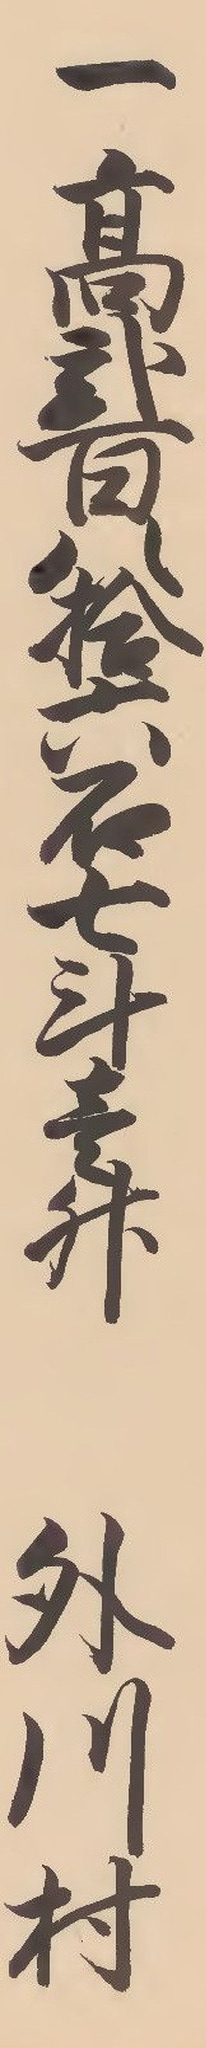一高弐百八拾六石七斗壱升外川村
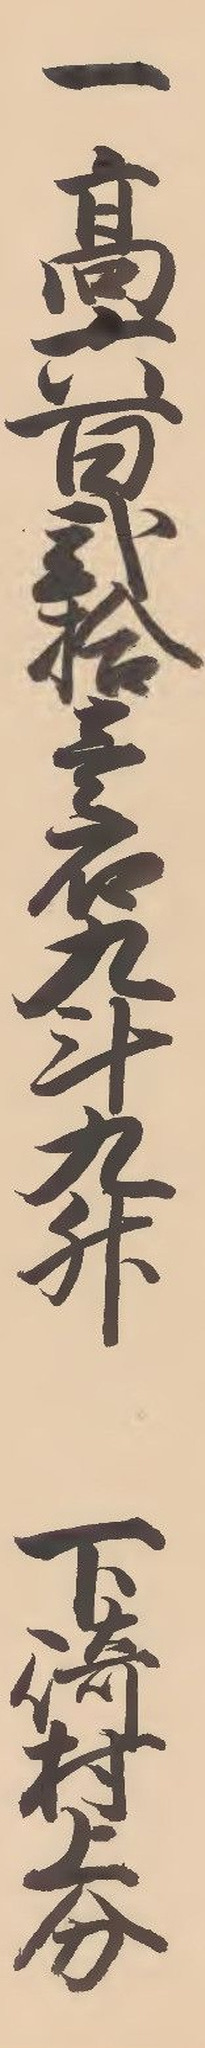一高六百弐拾壱石九斗九升下崎村上分
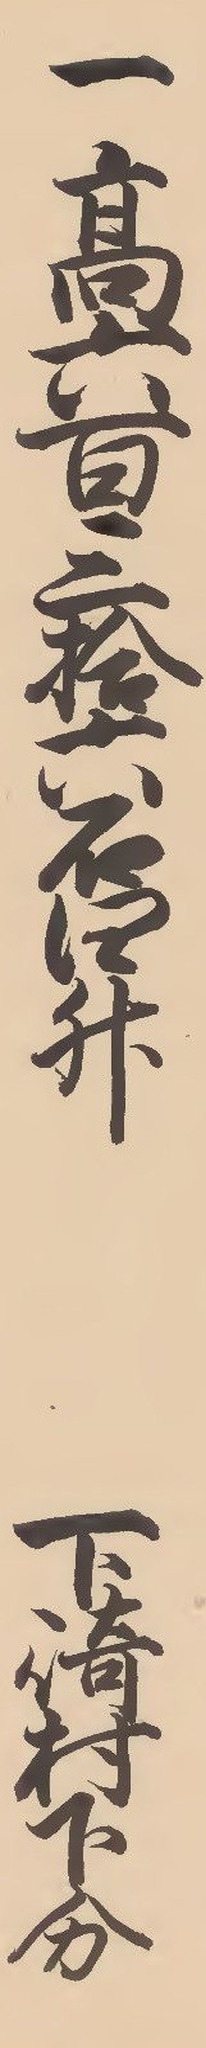一高六百三拾六石四升下崎村下分
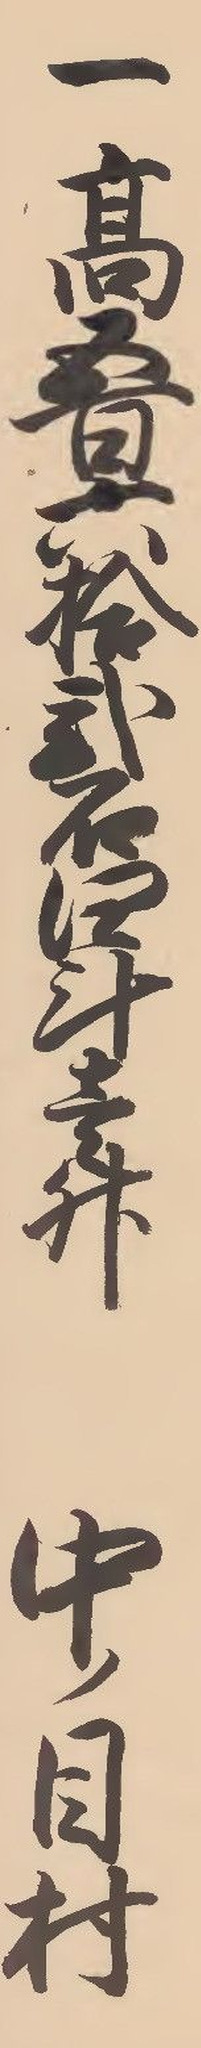一高五百六拾弐石四斗壱升中ノ目村
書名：武蔵国郷帳　下
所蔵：国立公文書館 National Archives of Japan
